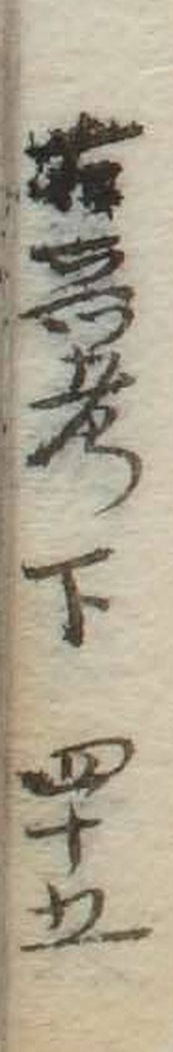古歌考下四十五

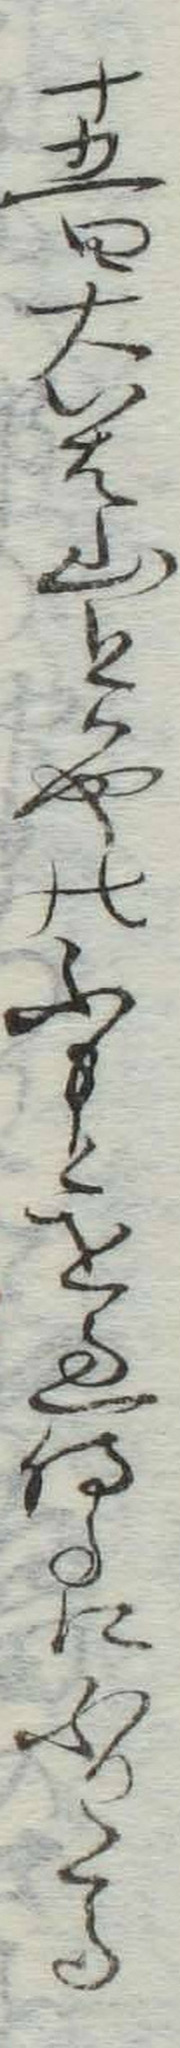十五日大いは山とかやのふもとを過侍るにふりたる
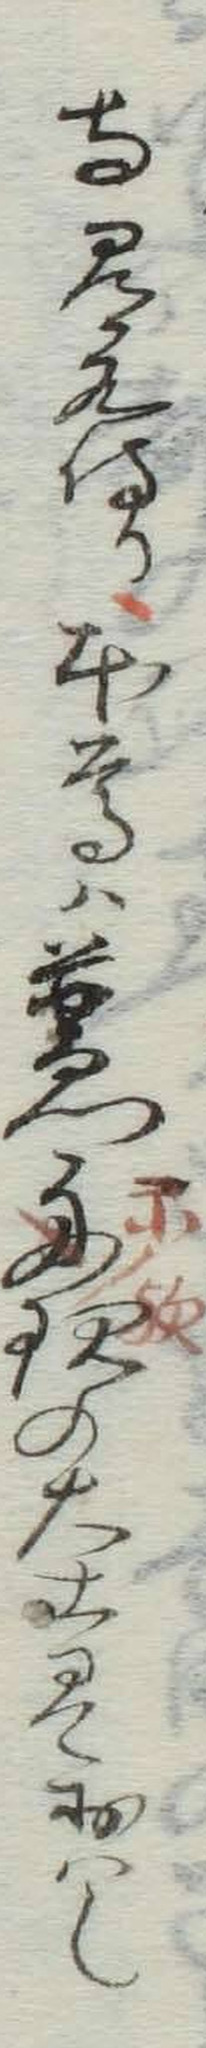寺見え侍り、本尊は普門示現の大士にておはし
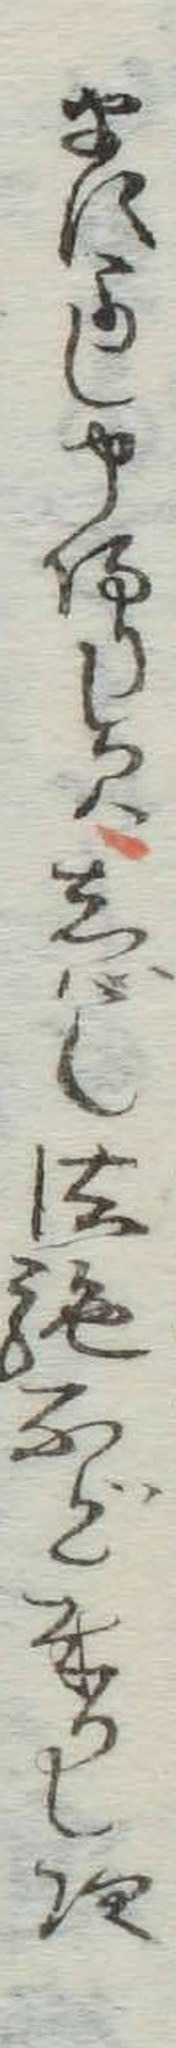ますよし申侍りしかは、しばし法施など奉りし次
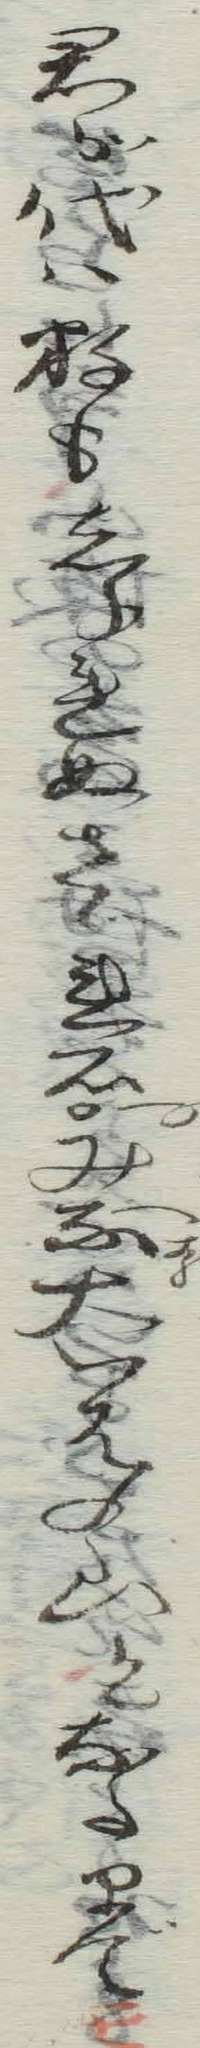君が代は数もしられぬさゞれ石｡みな大いはの山となるまでモ
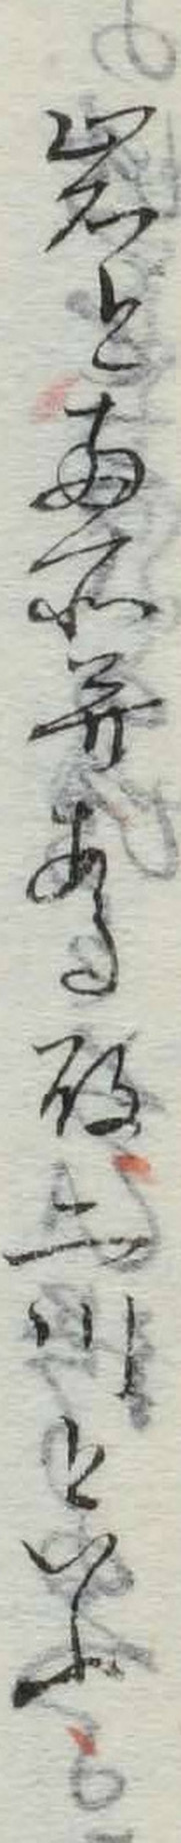岩と両所并ある故、二川といふ
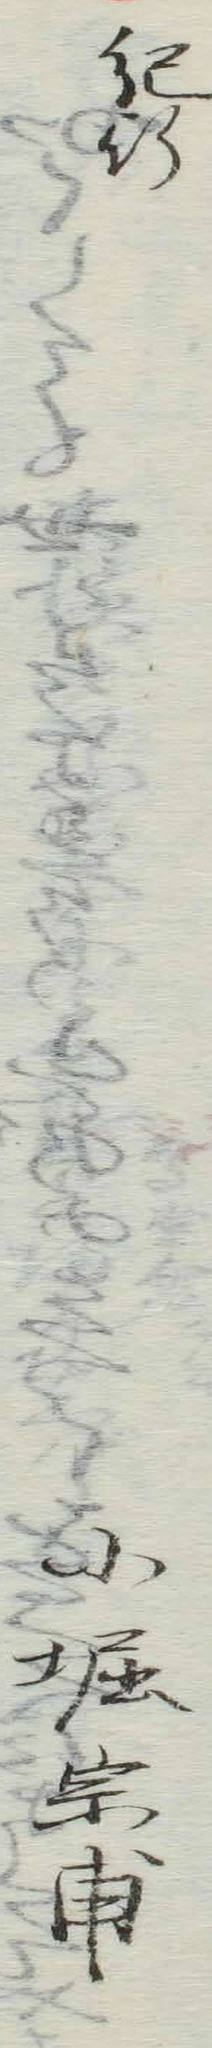○紀行小堀宗甫
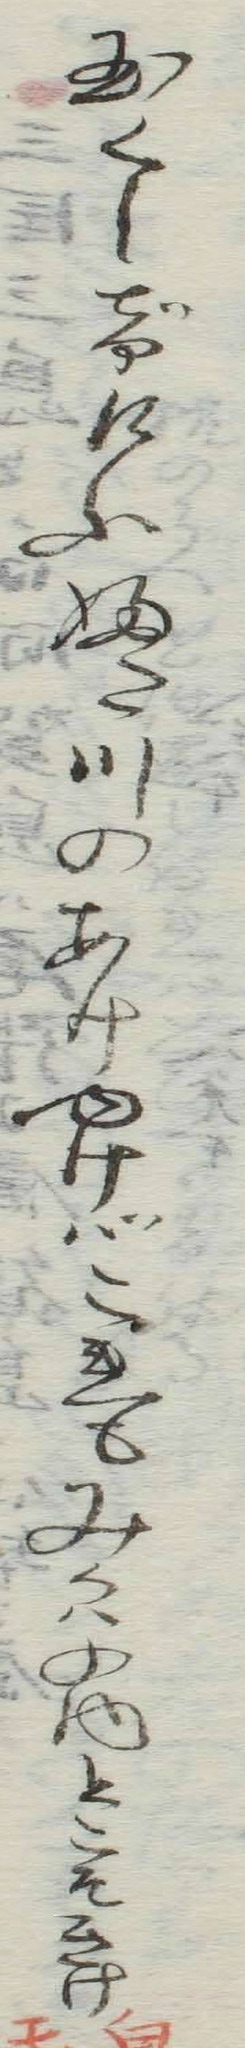玉くしげけふふた川のあけゆけばこれもみかはの内とこそきけ白モ
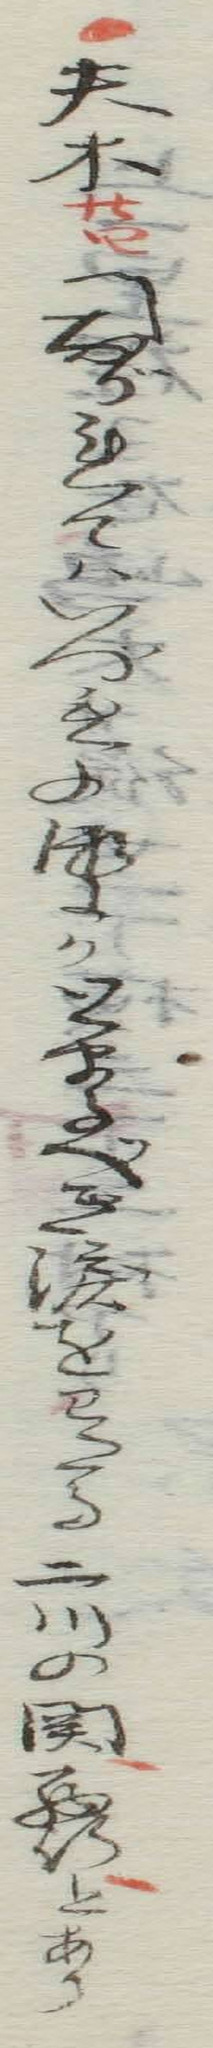●夫木廿四〽ながれてはいづれの瀬にかとまるべき涙をわたる二川の関、西行、とあり

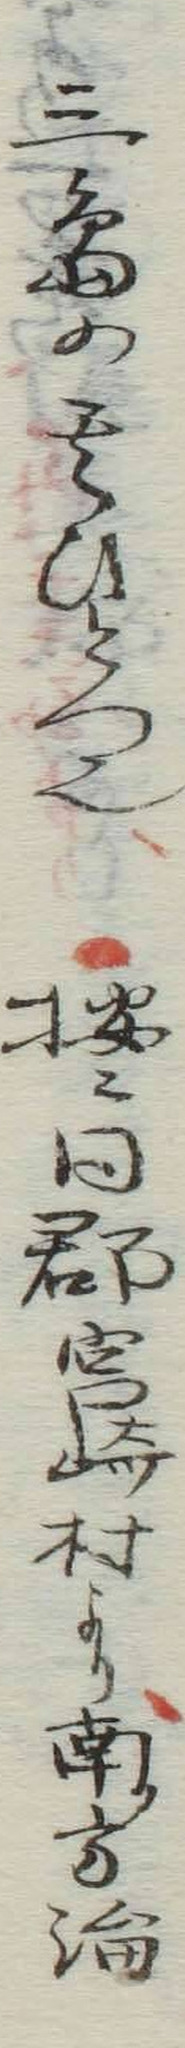三島の其ひとつ也、●按ニ同郡宮崎村より、南方
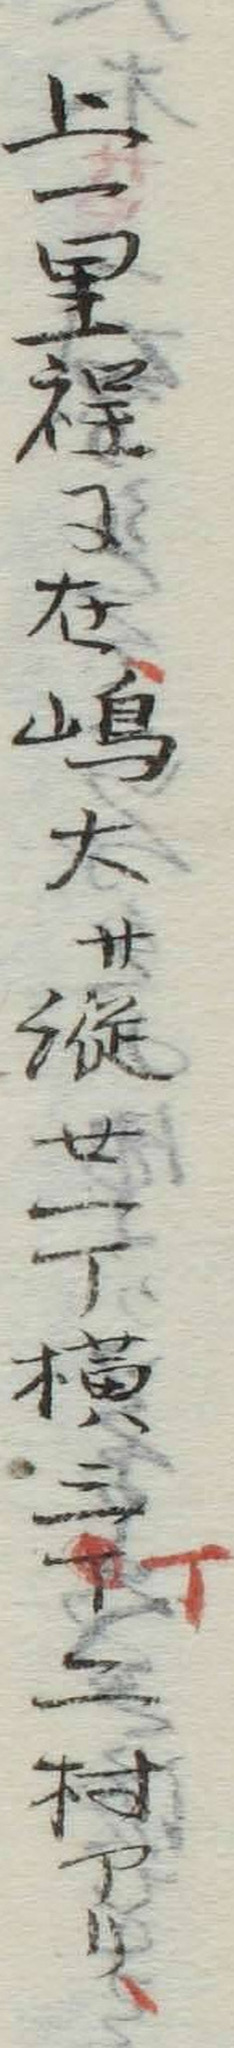上一里程に在、島大サ縦廿一丁横三丁二村アリ、
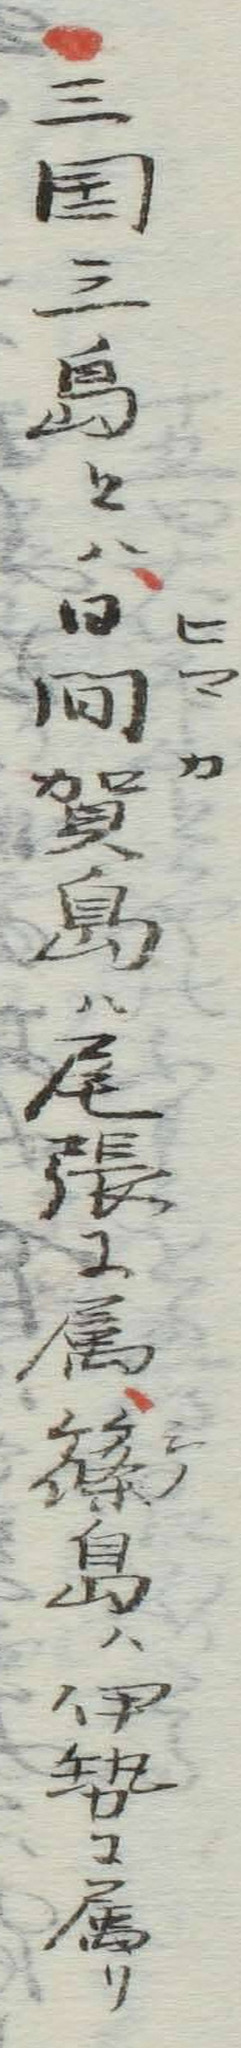●三国三島とは、日間賀島は尾張に属、篠島は伊勢に属り
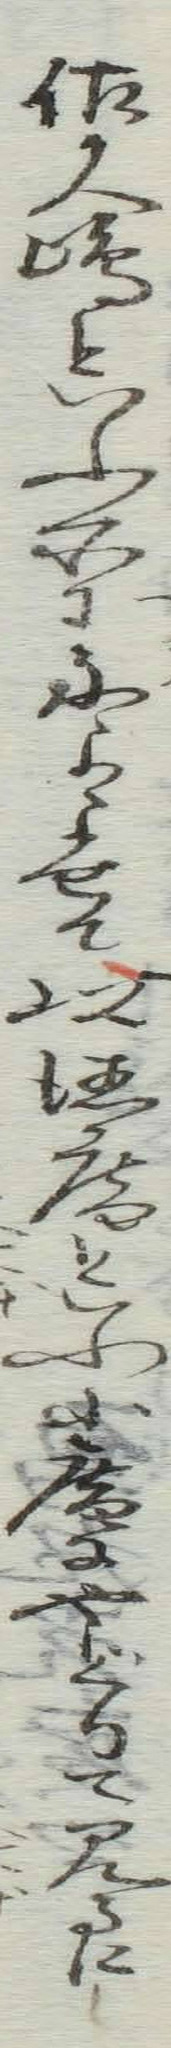佐久嶋といふ所に舟よよせて、以徳庵といふ小庵にやどりて見るに
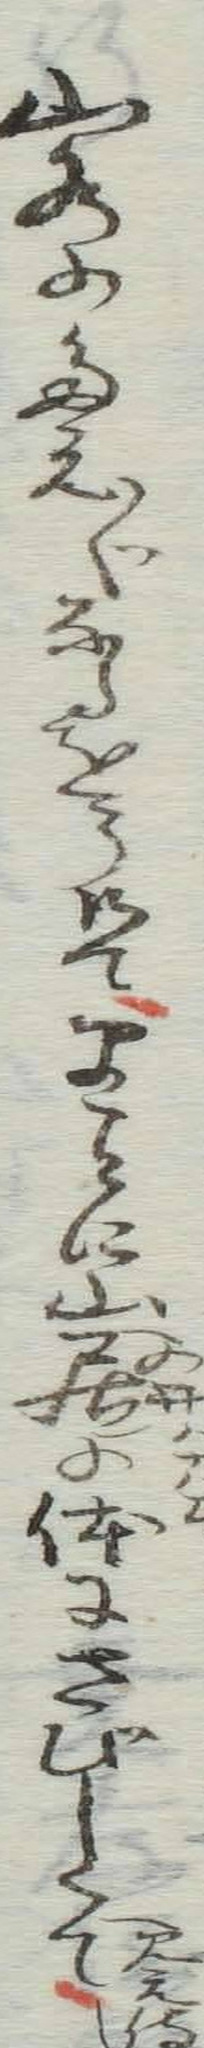山水のたえ〴〵なるをうけて、まことに山居の体にさびしくて、
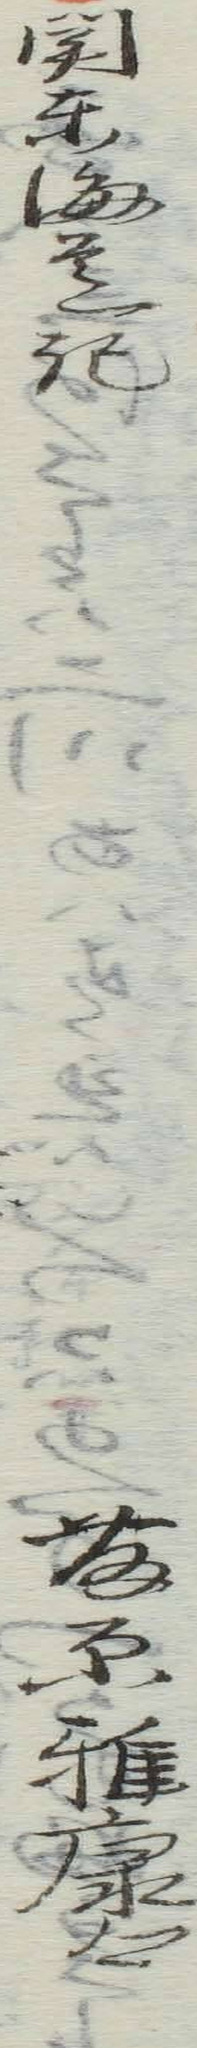●関東海道記藤原雅世卿
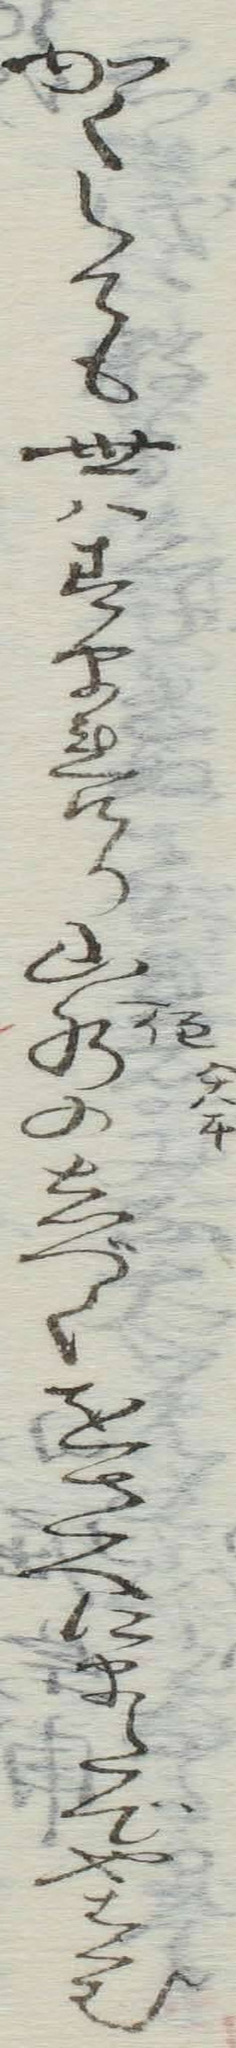かくしても世はすまれけり山水のしづくをさへにまたでやはくむ
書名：三河国古跡考
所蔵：国文学研究資料館
